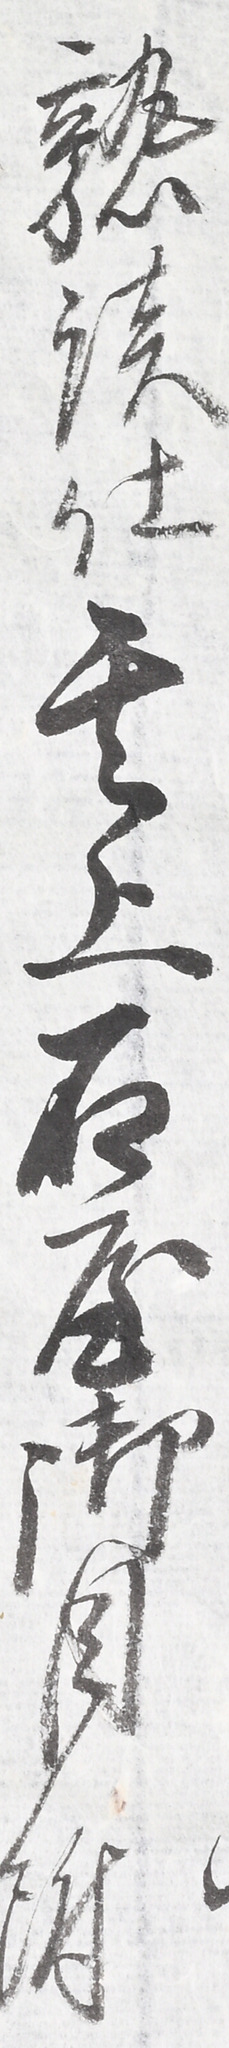熟談仕其上石屋御目附
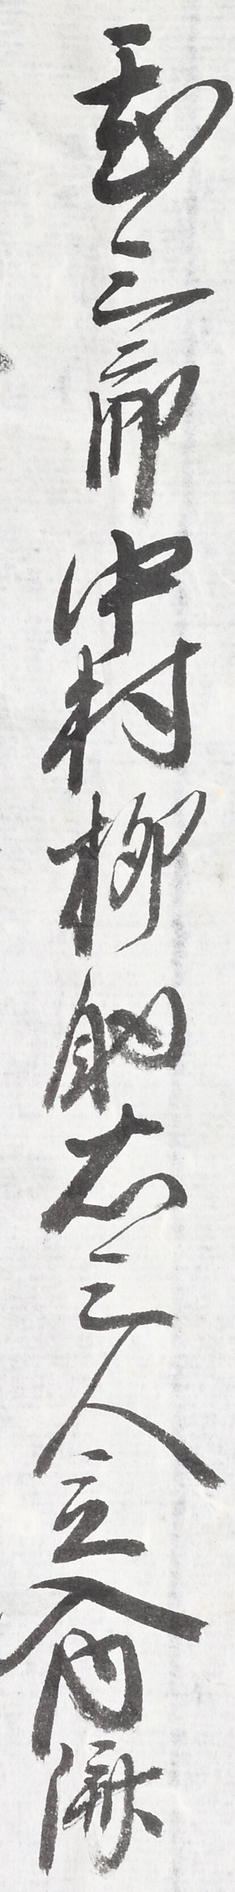甚三郎中村柳助右三人立入内済
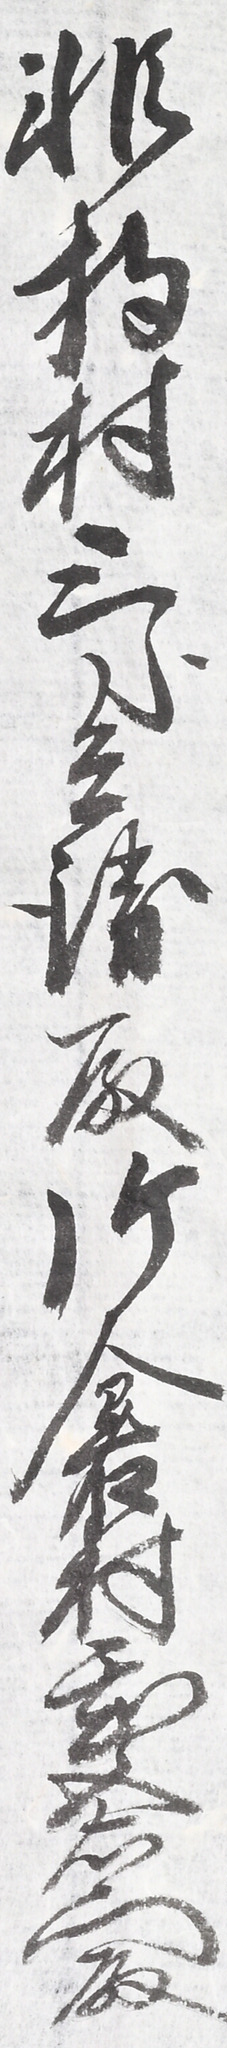非持村三郎兵衛殿片倉村甚五右衛門殿
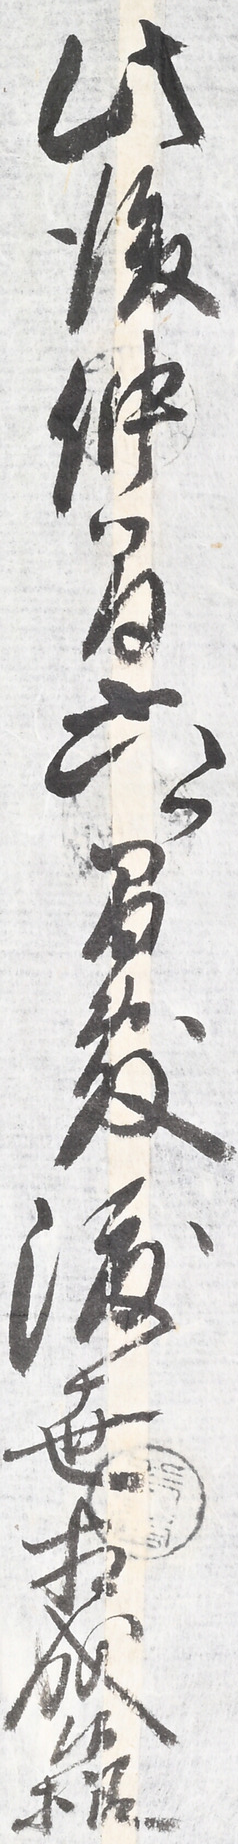此後仲間六つ間敷渡世相成候様
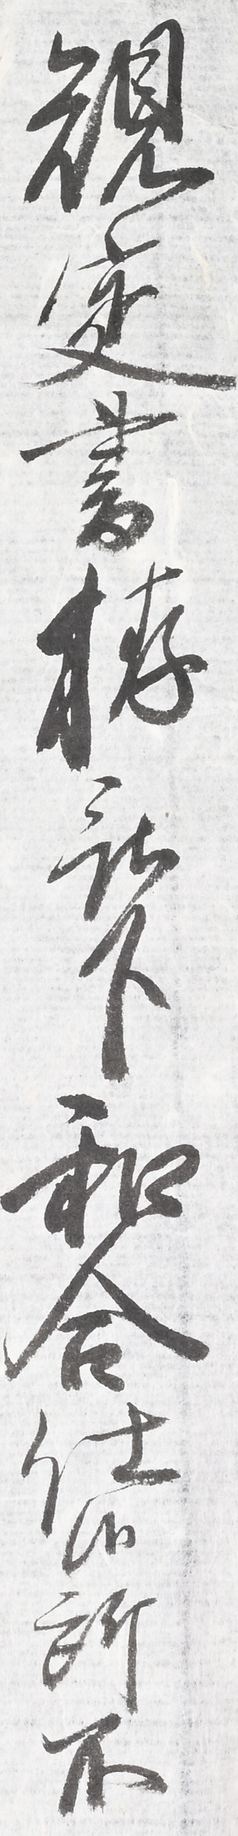規定書拵被下和合仕候所不
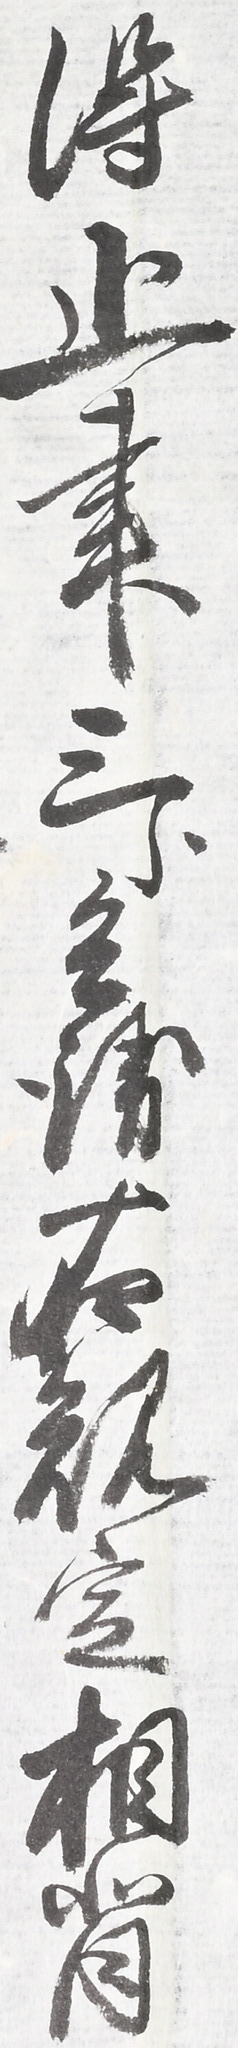得止事三郎兵衛右規定相背
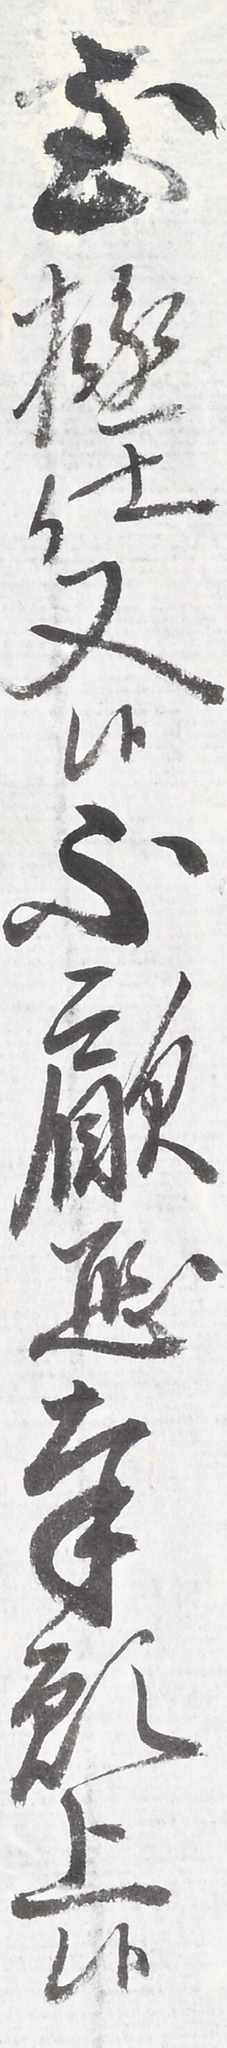至極仕又候不顧恐奉願上候
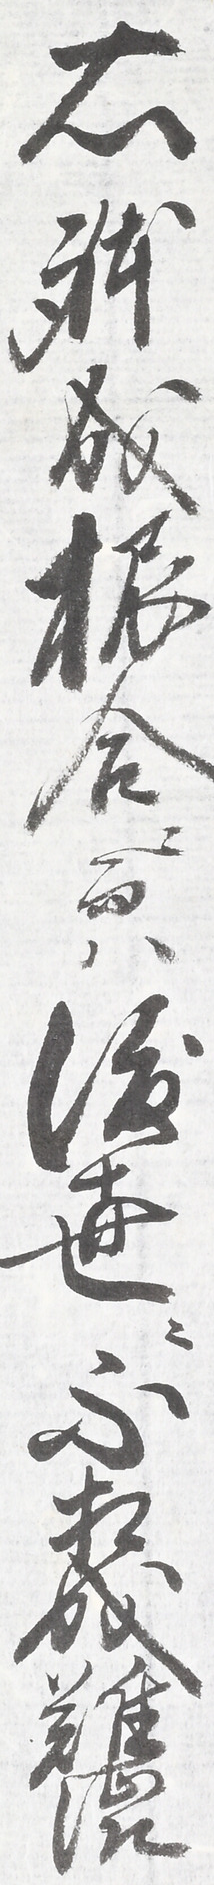右躰成振合ニ而ハ渡世ニ不相成難渋
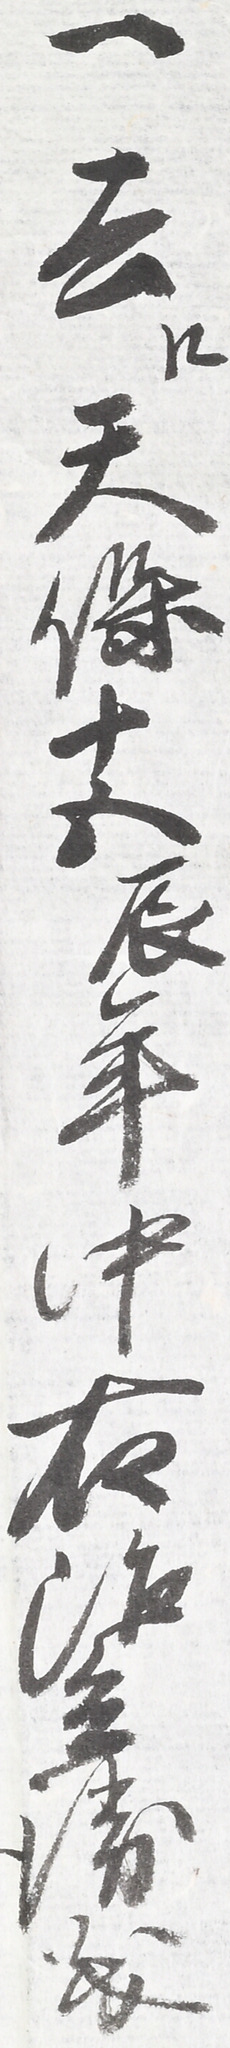一去ル天保十五辰年中右治兵衛義
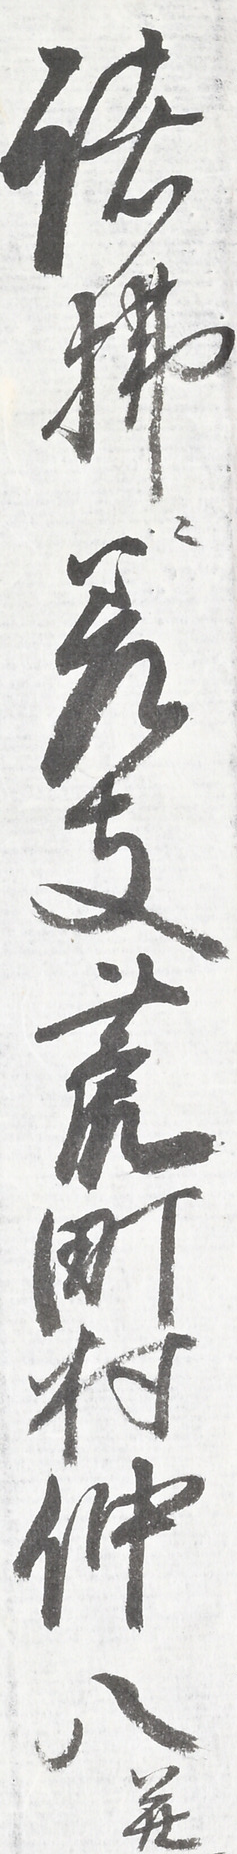諸払ニ差支荒町村仲八幷ニ
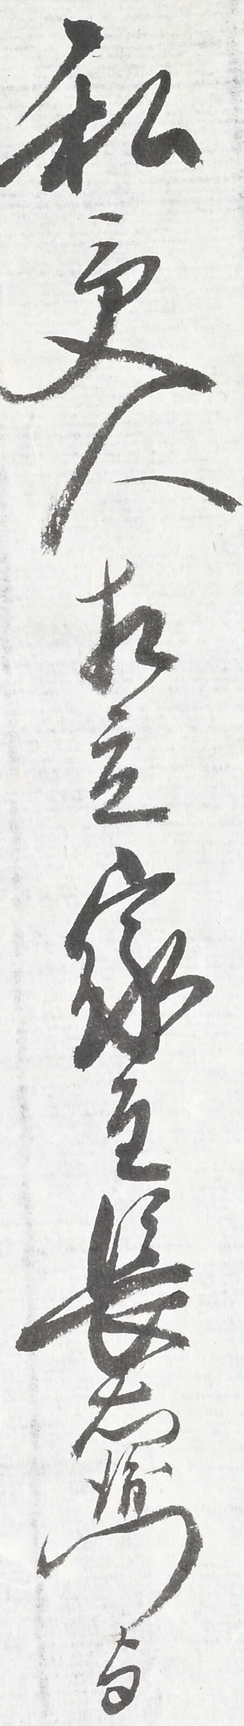私受人相立家主長右衛門与
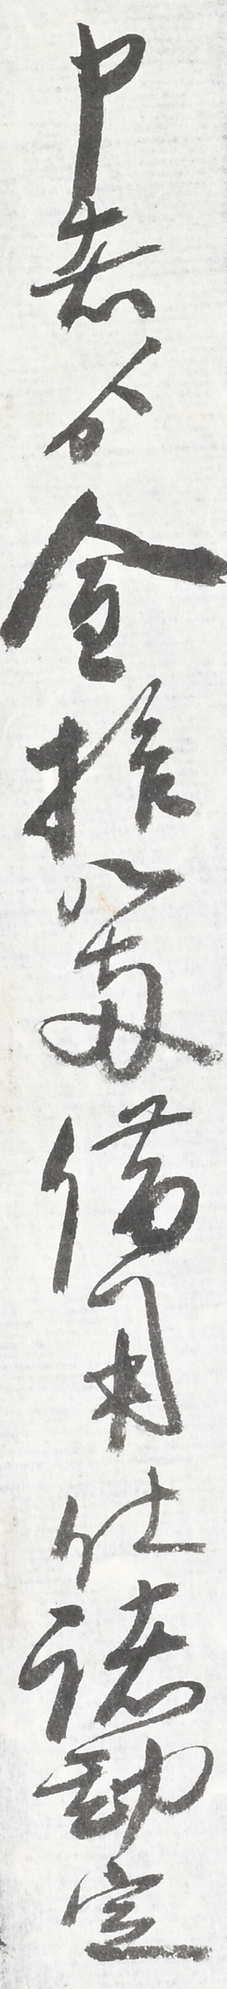申者ゟ金拾八両借用仕諸勘定
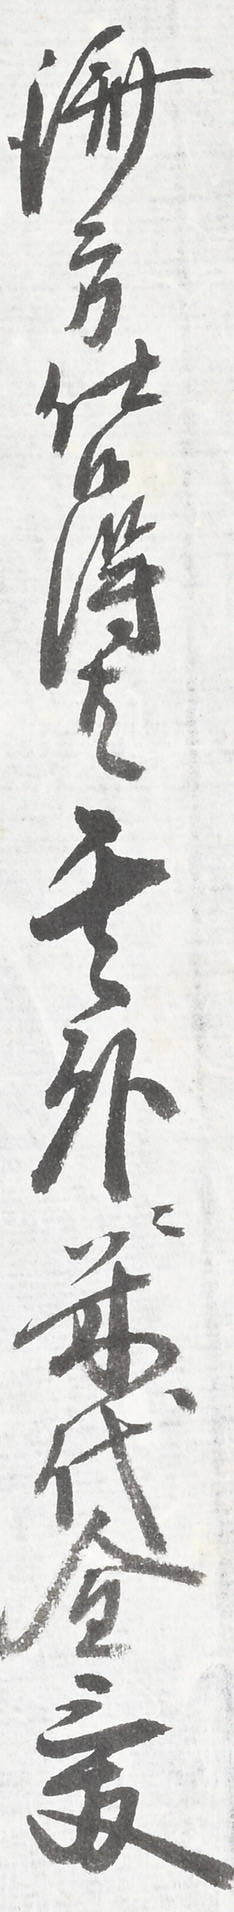済方仕候得共其外ニ米代金三両
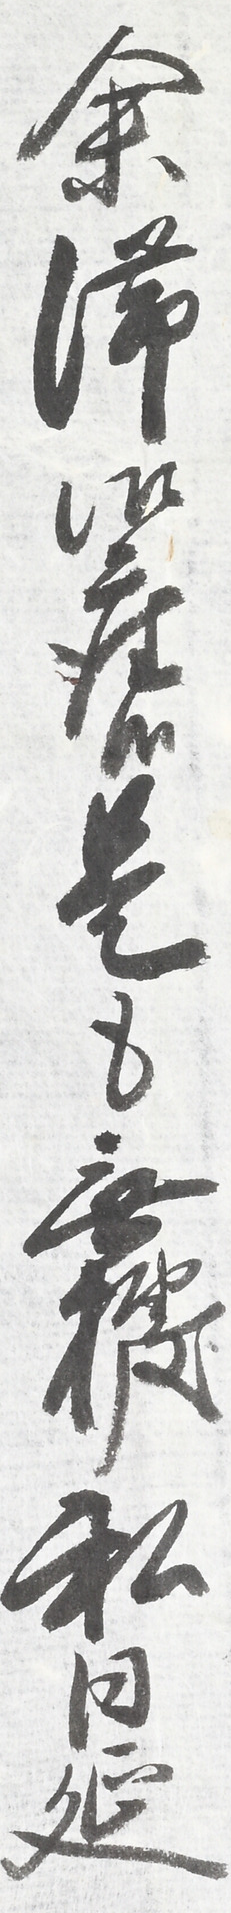余滞御座候是も無拠私日延
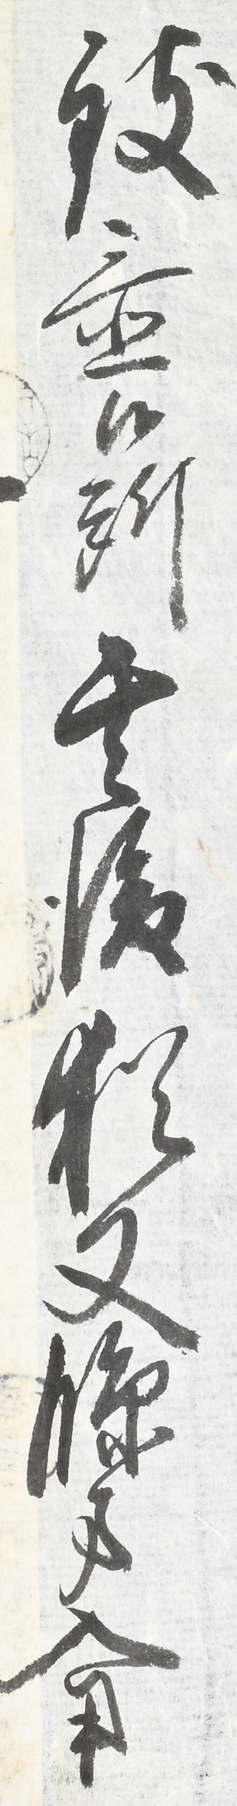致置候所其後猶又臨事入用
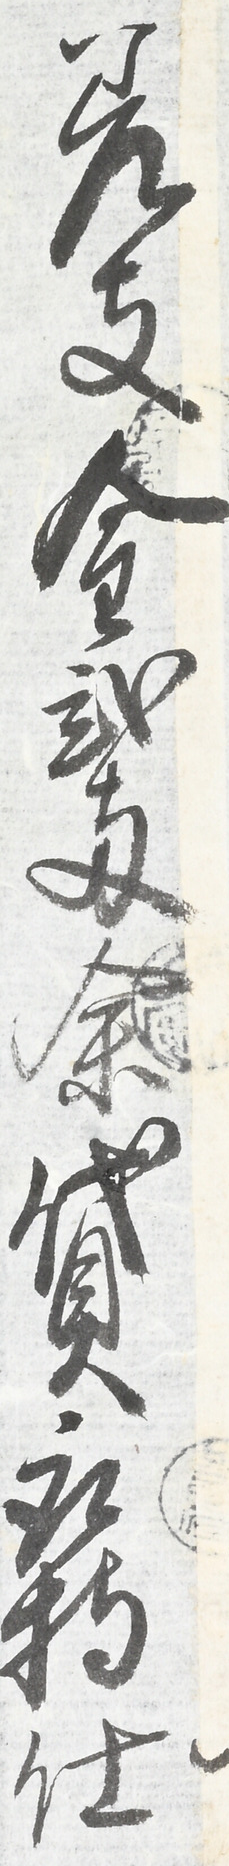差支金弐両余貸取持仕
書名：乍恐以書付奉願上候
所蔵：伊那市立高遠町図書館・合同会社AMANE
